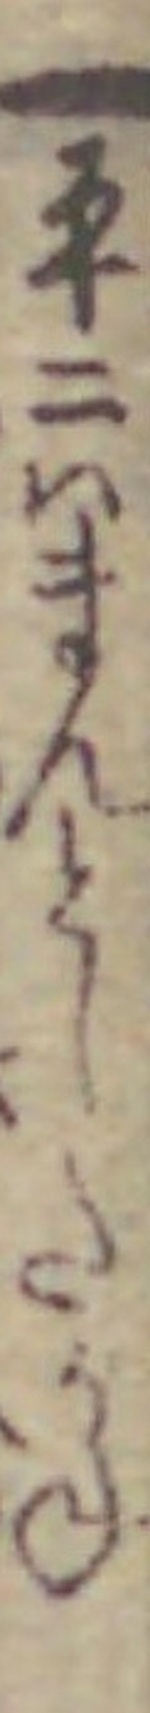平二まんまとしたかね
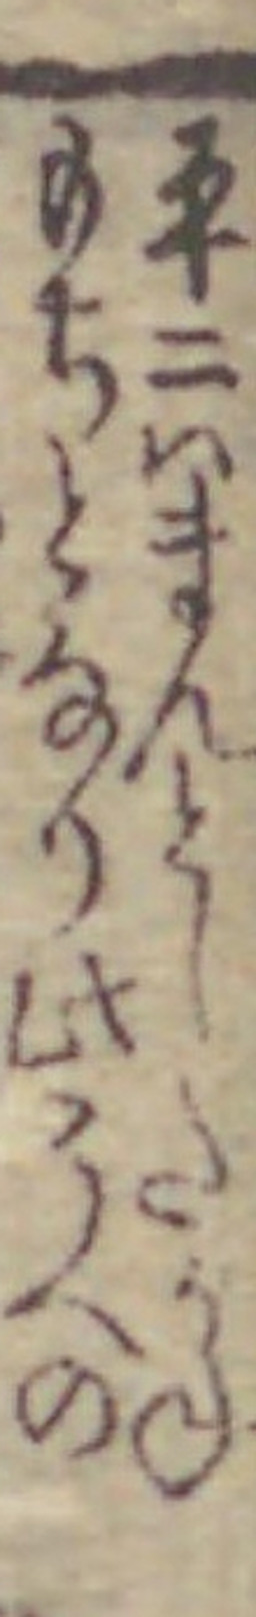もちとなり此うへの
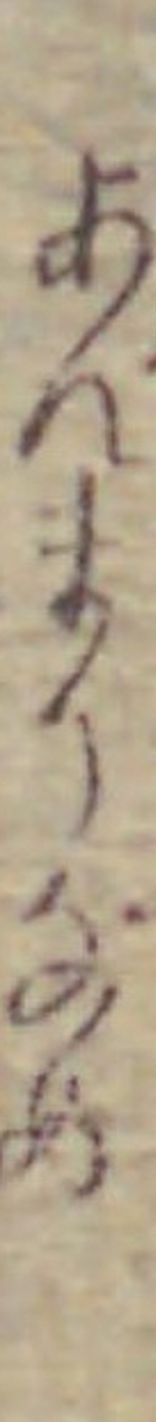あんまりなめ
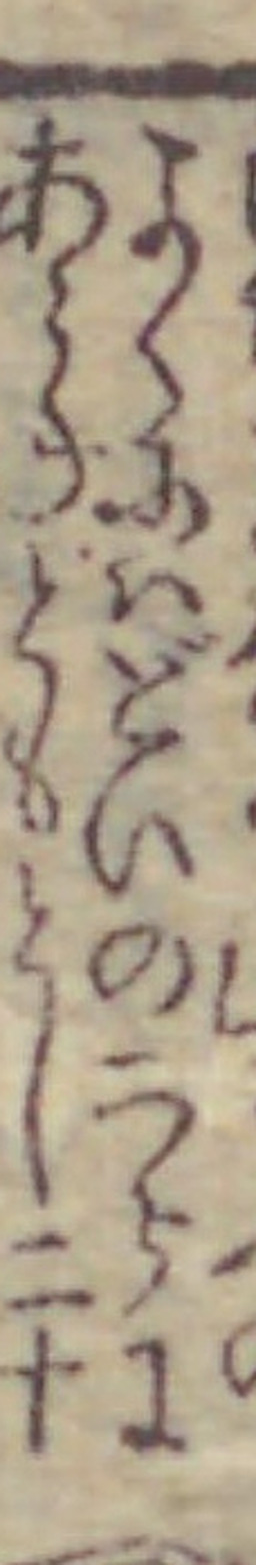あらねどもとし二十
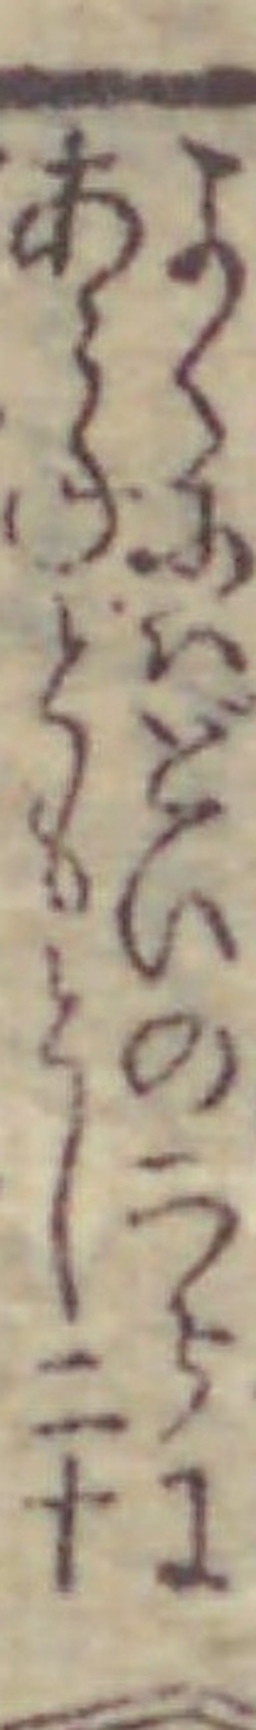あらねどもとし二十
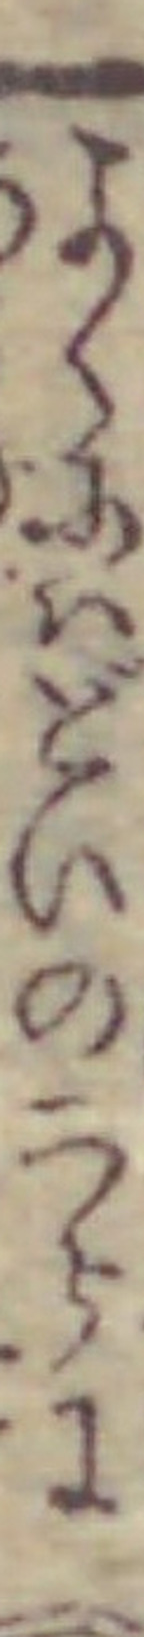よくにはどいの二郎に
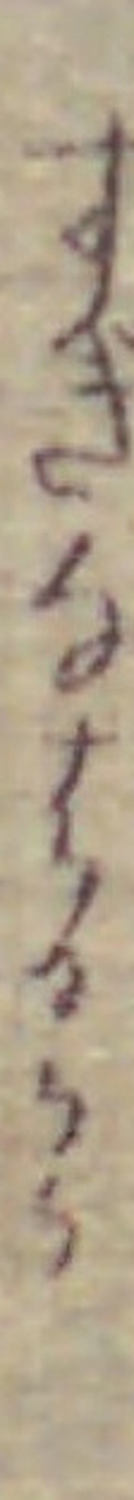すぎなはるから
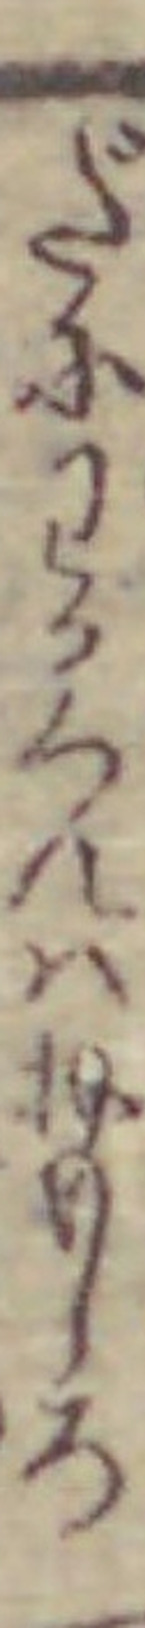だにわかくんはおもしろ
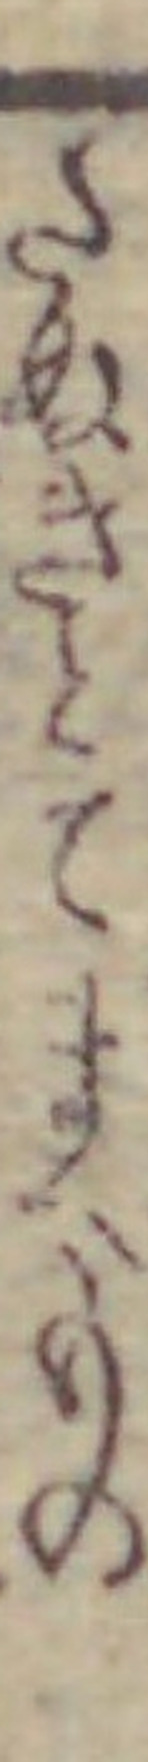たぬきとてまへもの
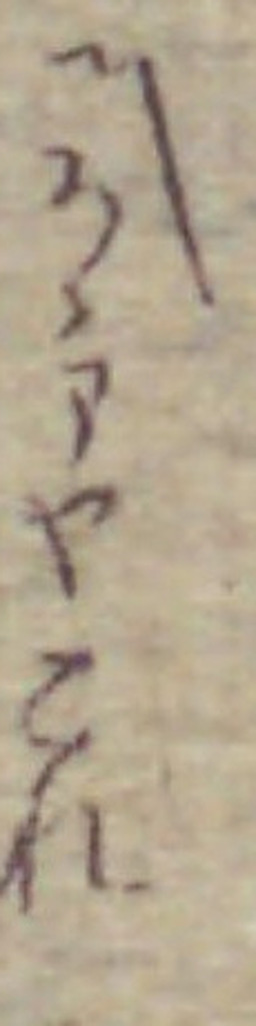〽かゝァやこれ
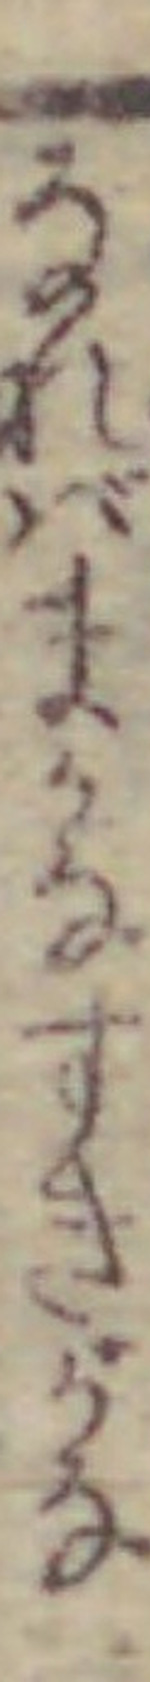なればまかなすきがな
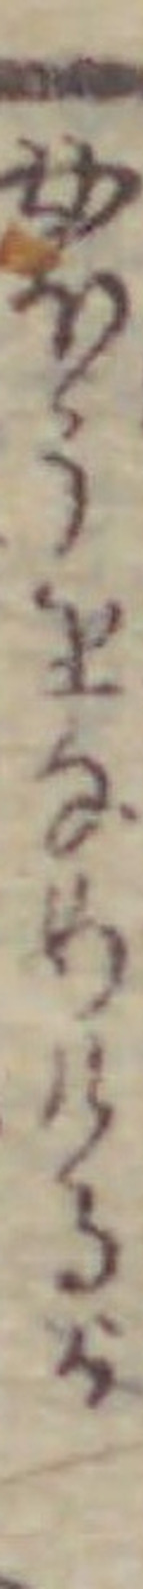女ほうをなめけるが
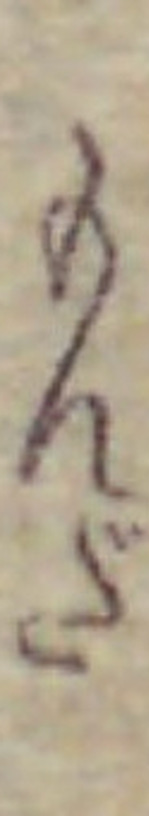もんだ
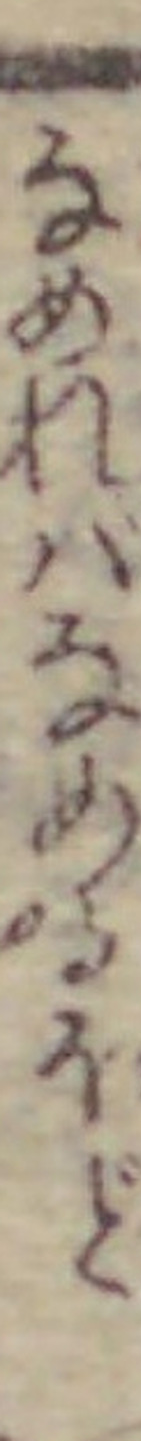なめればなめるほど
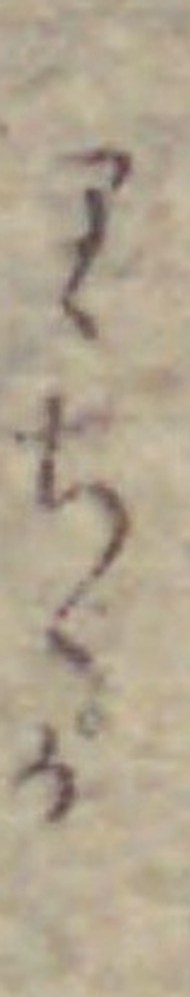アヽちゝが
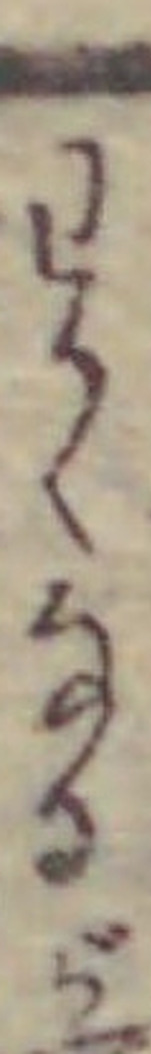わかくなるが
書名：箱入娘面屋人魚 3巻
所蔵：国立国会図書館 National Diet Library, JAPAN
